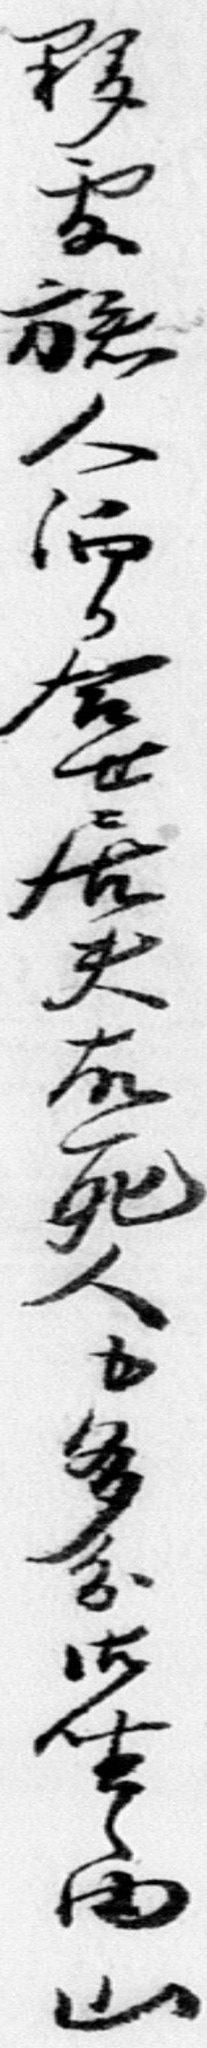夥敷旅人泊り合せ居夫故死人も多分御座候由山
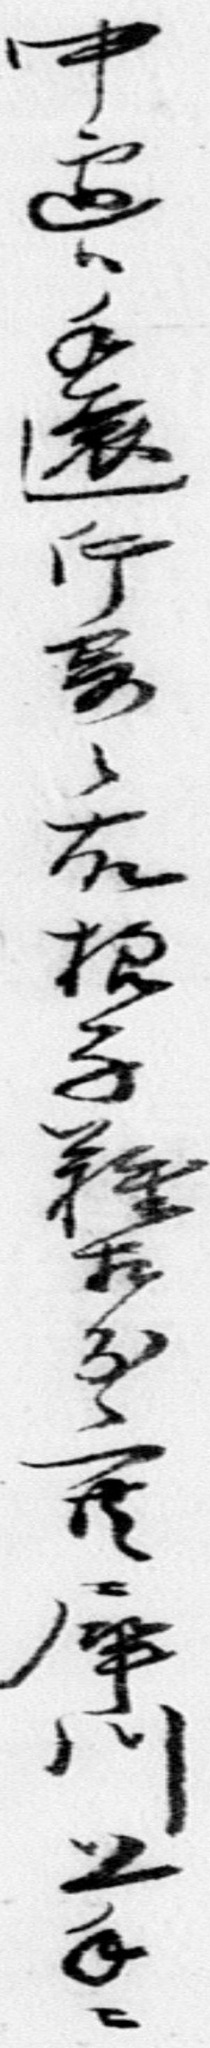中辺は手遠片寄候故様子難相分候へ共犀川上手に
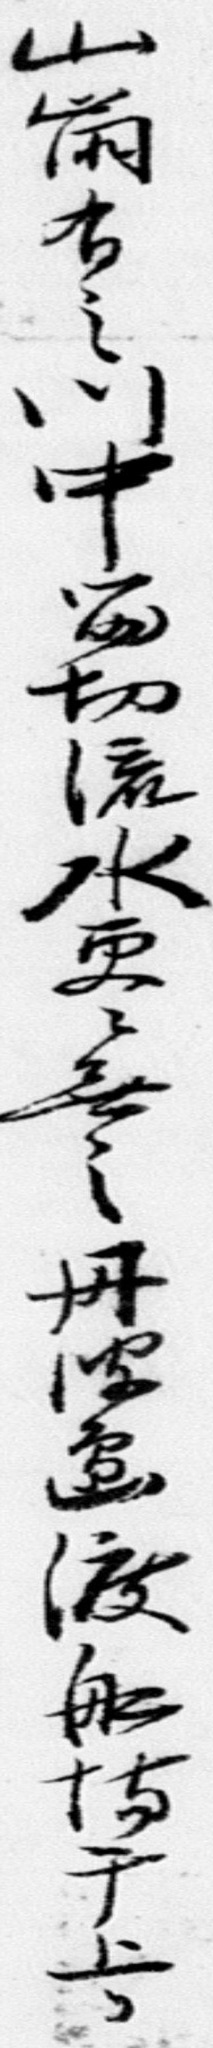山崩有之川中留切流水更に無之丹波島渡船船場干上り
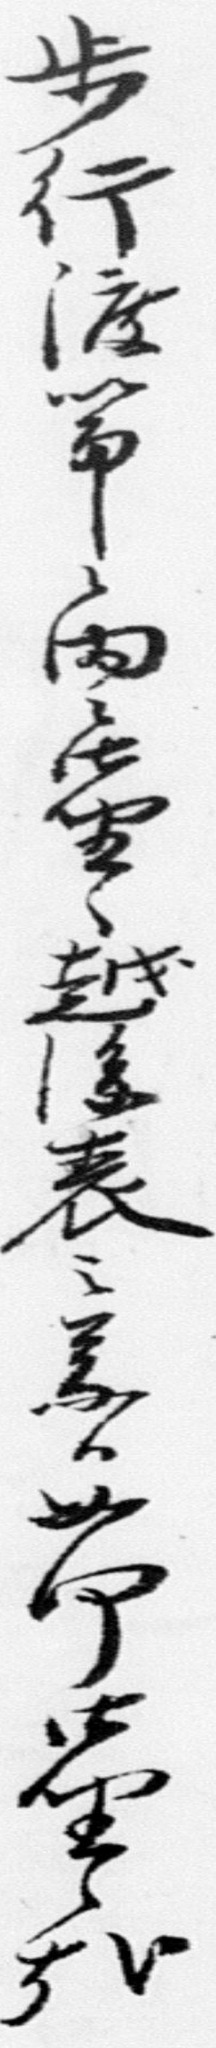歩行渡いたし候由に御座候越後表之義は如何御座候哉
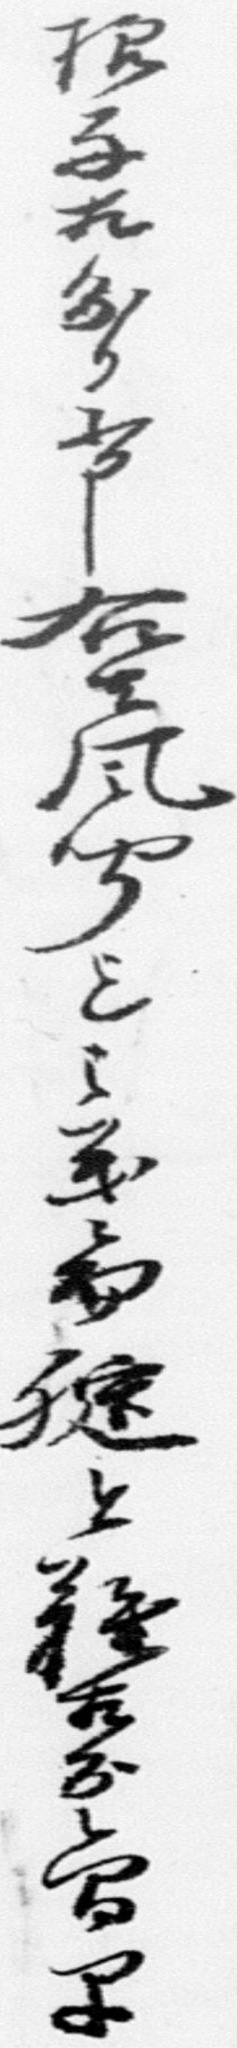様子相分り不申右は風聞迄之義に而聢と難相分候間早
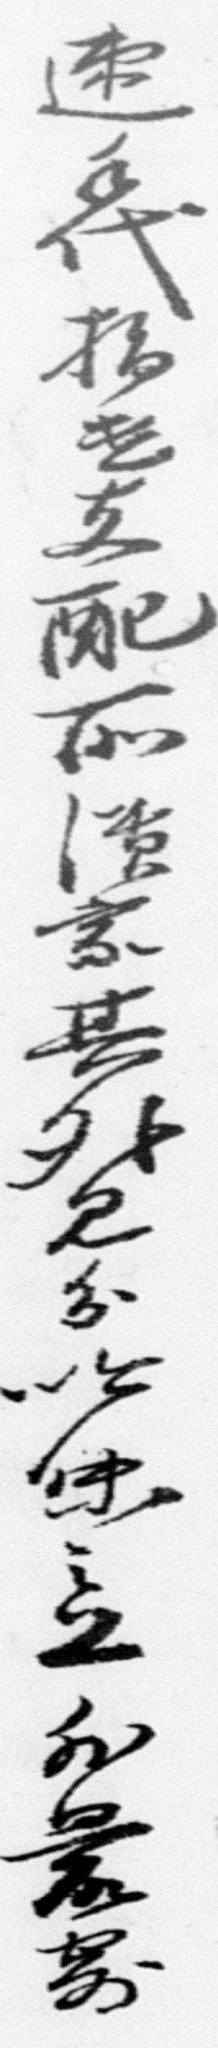速手代指遣支配所潰家其外見分吟味之上外最寄
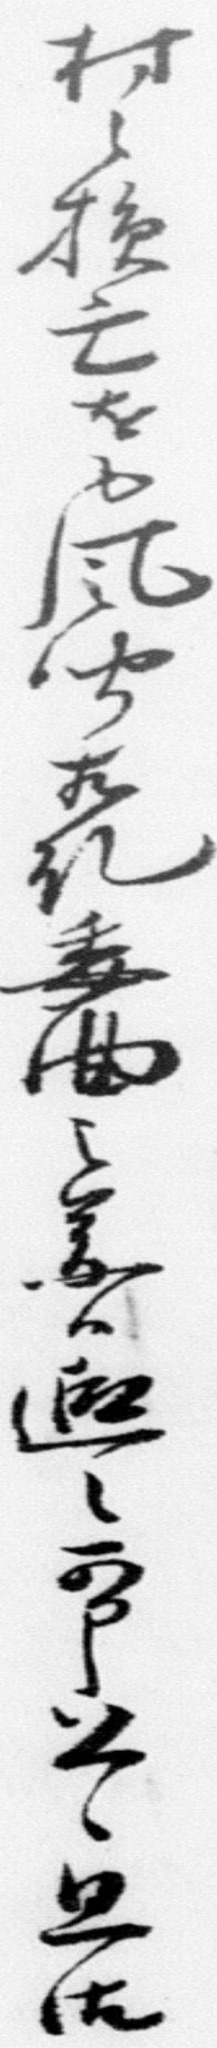村々損亡をも風聞相糺委曲之義は追々可申上候但御
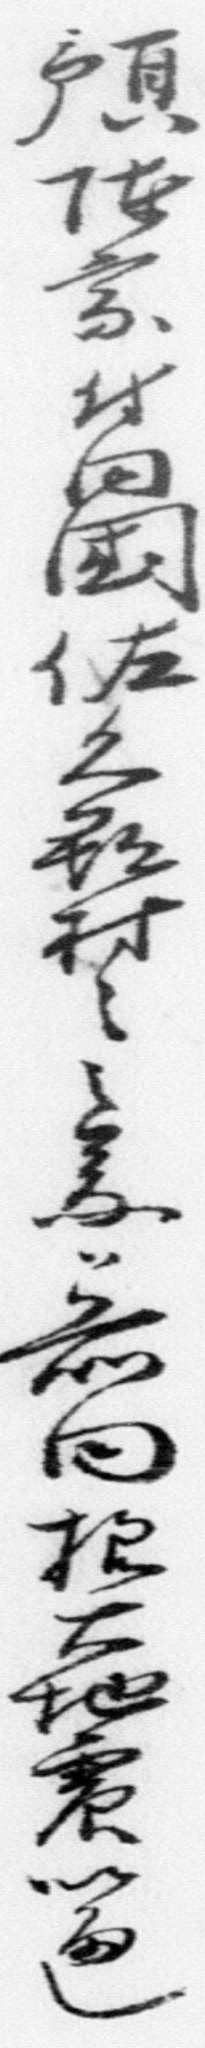預陣家付同国佐久郡村々之義は前同様大地震いたし
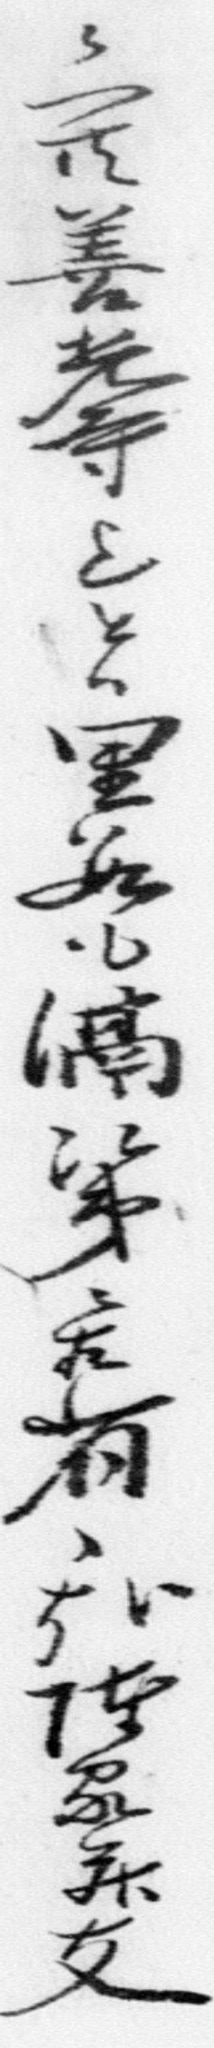候へ共善光寺迄とは里数も隔次第に相省候哉陣家幷支
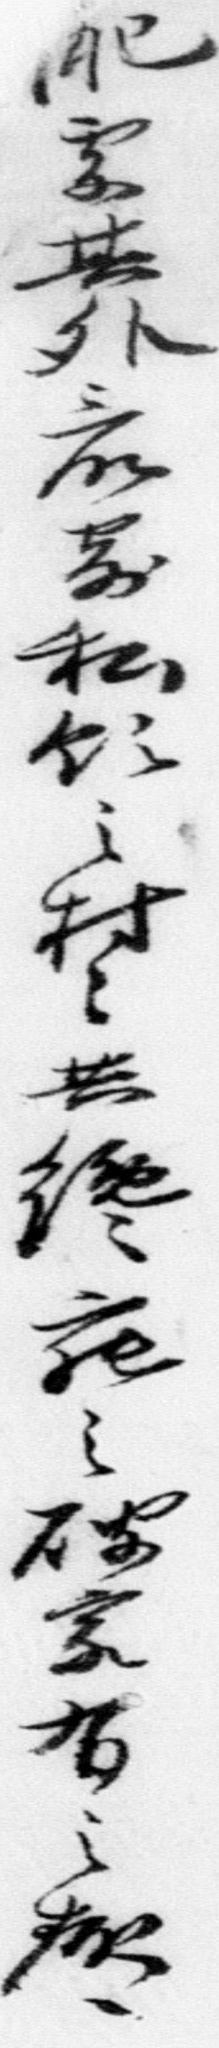配処其外最寄私領之村々共纔宛之破家有之趣候
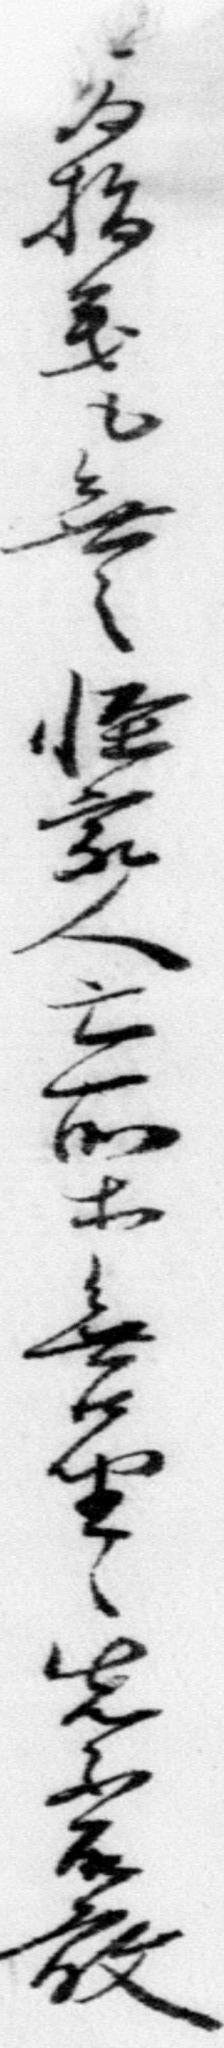為指義も無之怪我人亡所等無御座候不取敢
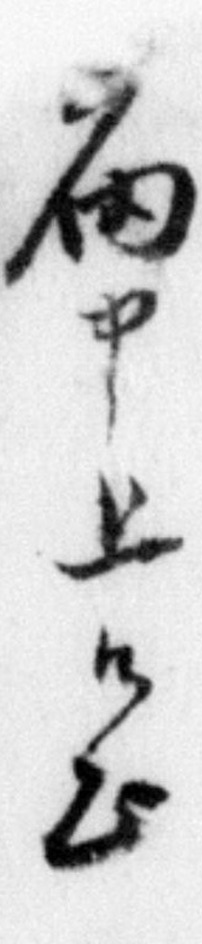届申上候以上

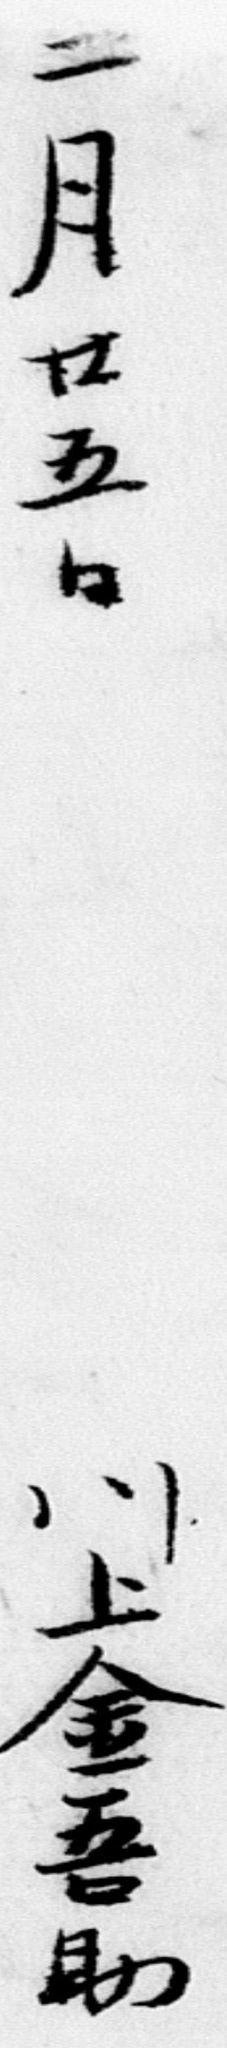二月廿五日川上金吾助
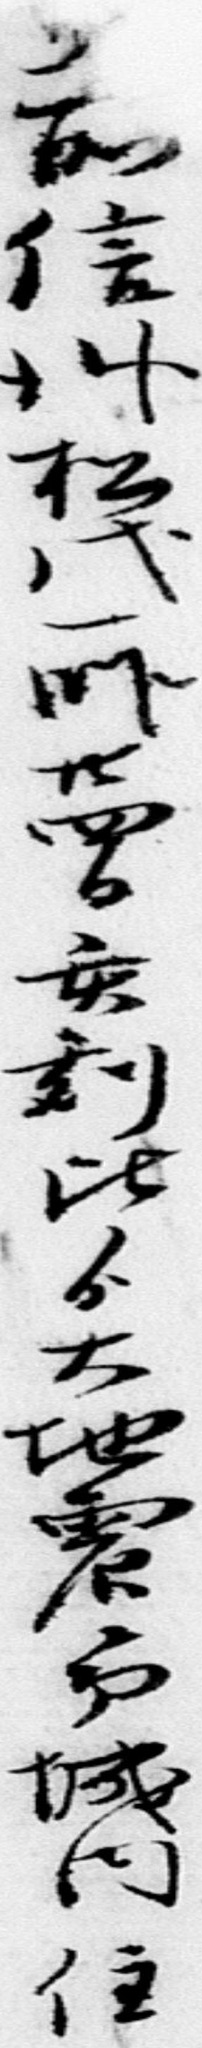り所信州松代一昨廿四日亥刻ゟ大地震に而城内住
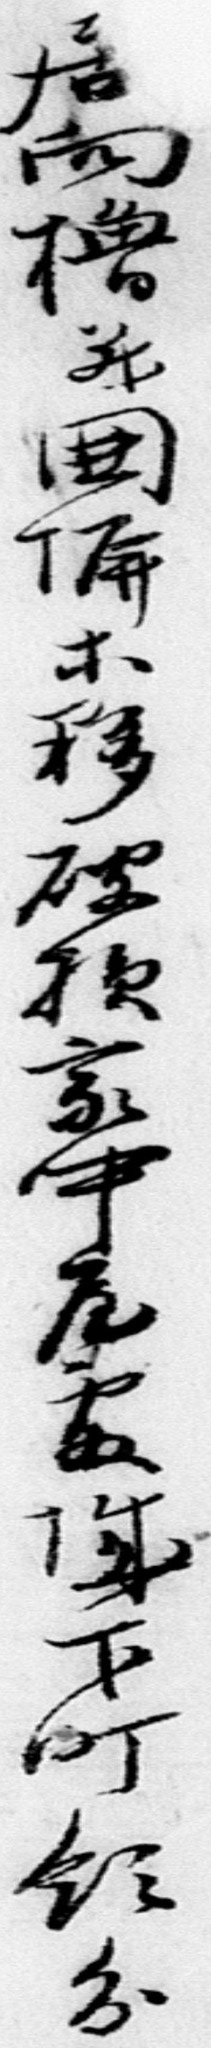居向櫓幷囲塀等夥破損家中屋敷城下町領分
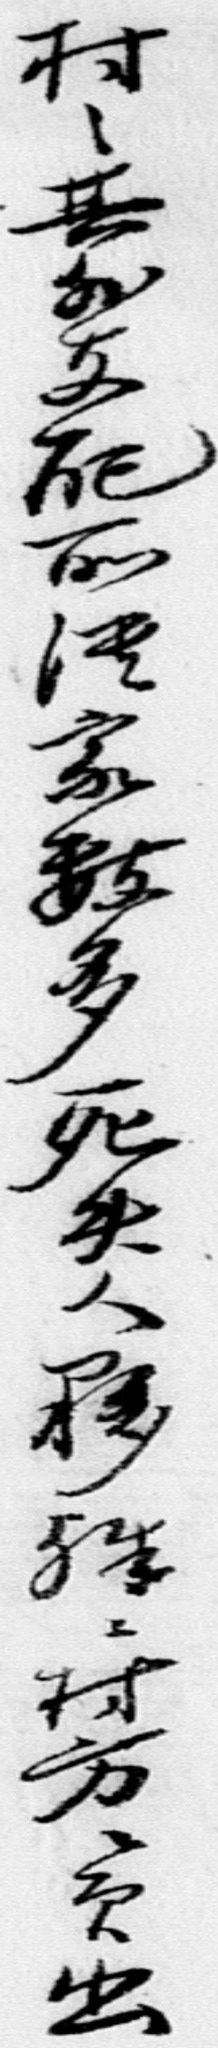村々其外支配所潰家数多死失人夥殊に村方に而は出
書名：信州大地震一件
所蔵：徳島県立図書館
